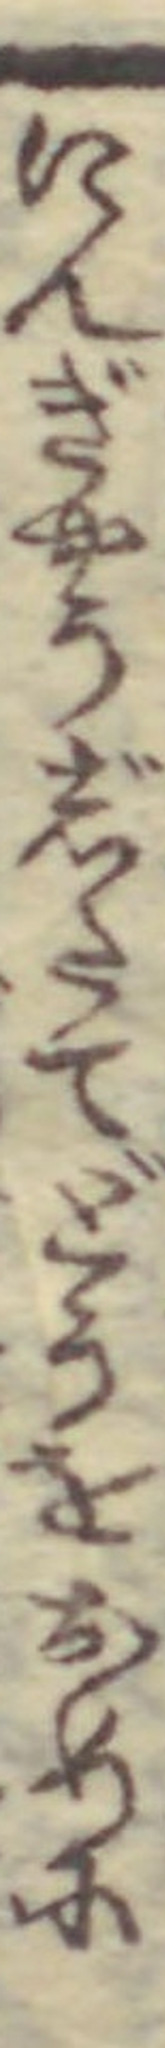にんぎやうじたてどうをおめに
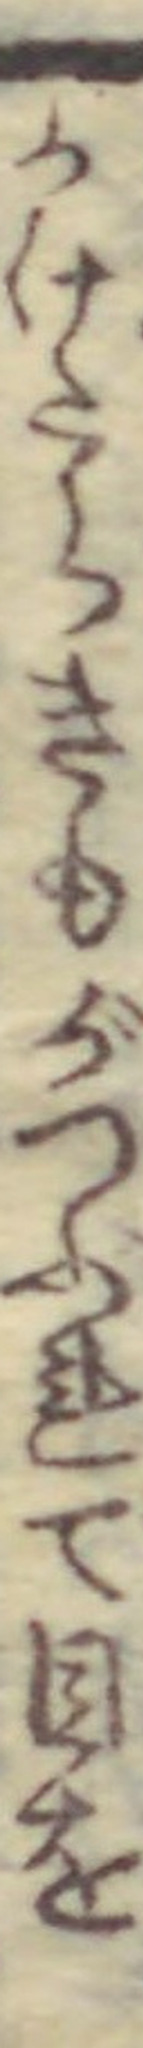かけたらきもがつぶれて目を
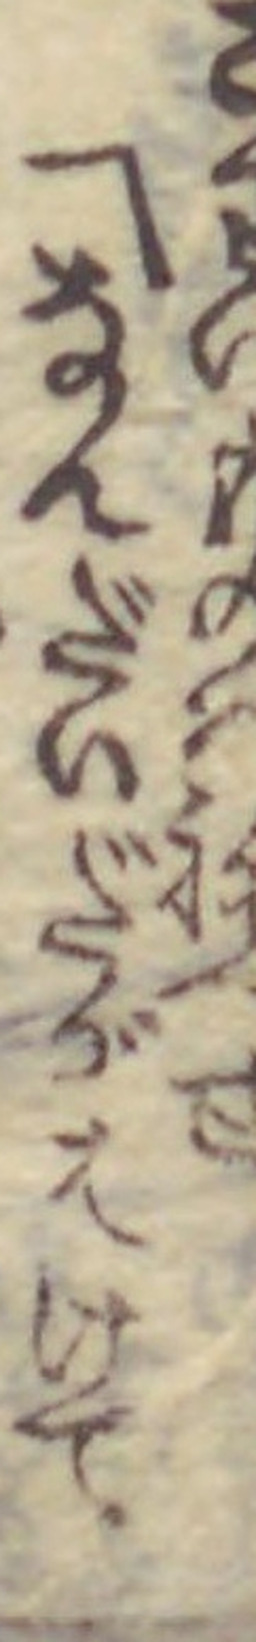〽なんだいだがはけて
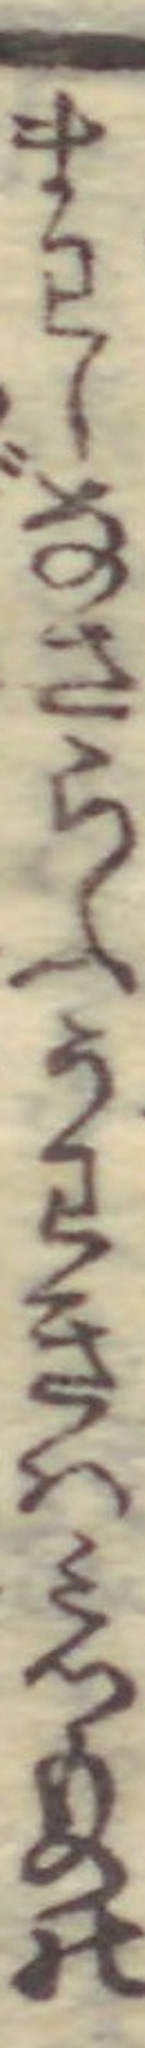まわしなさらふうわきはみつものの
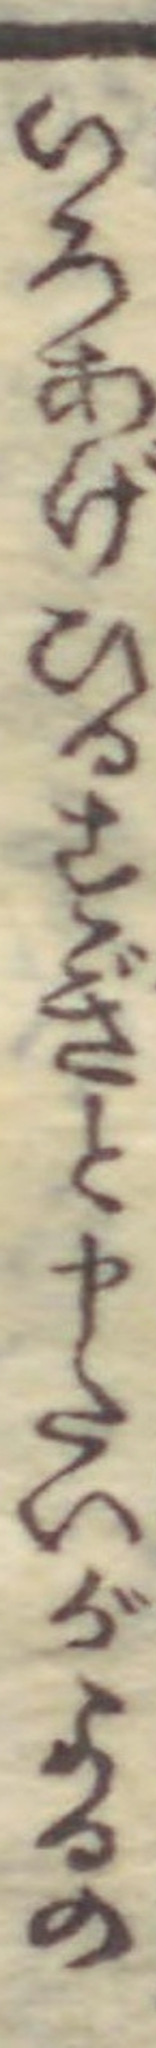いろあげひるすぎと申たいがよるの
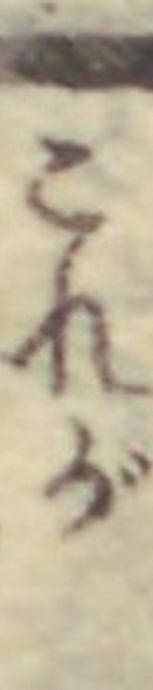これが
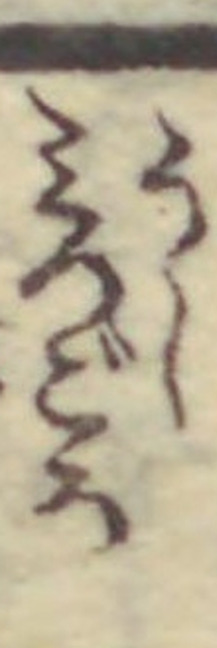みつごろ
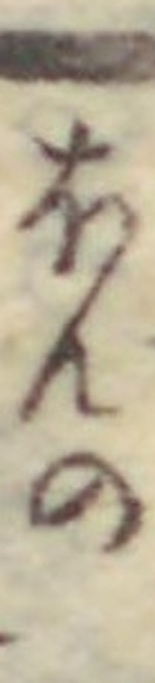ほんの
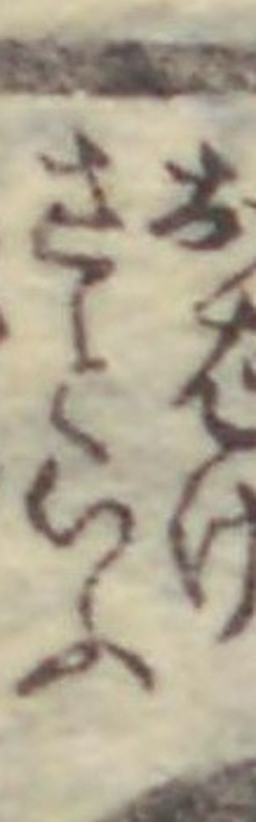さといふ
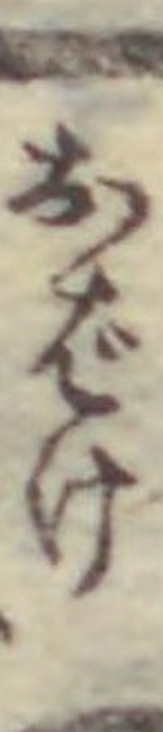おばけ
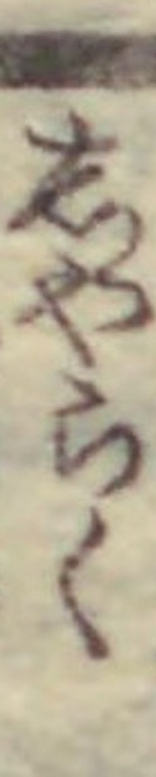しやらく
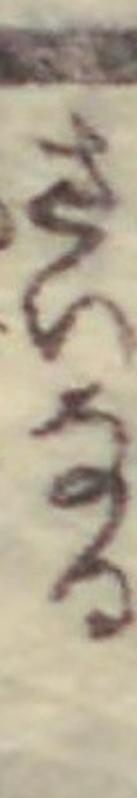さいなる
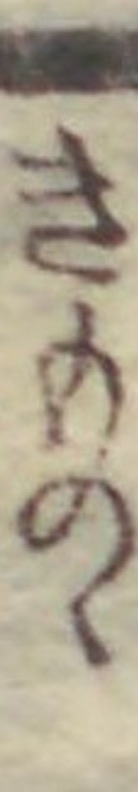きものゝ
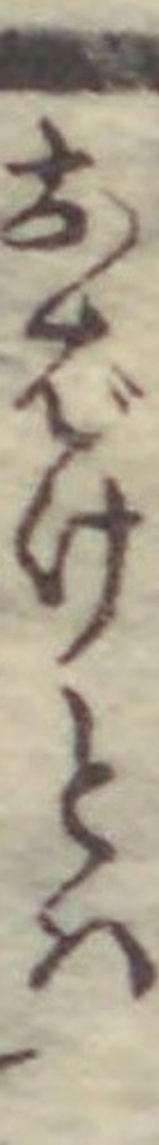おばけとは
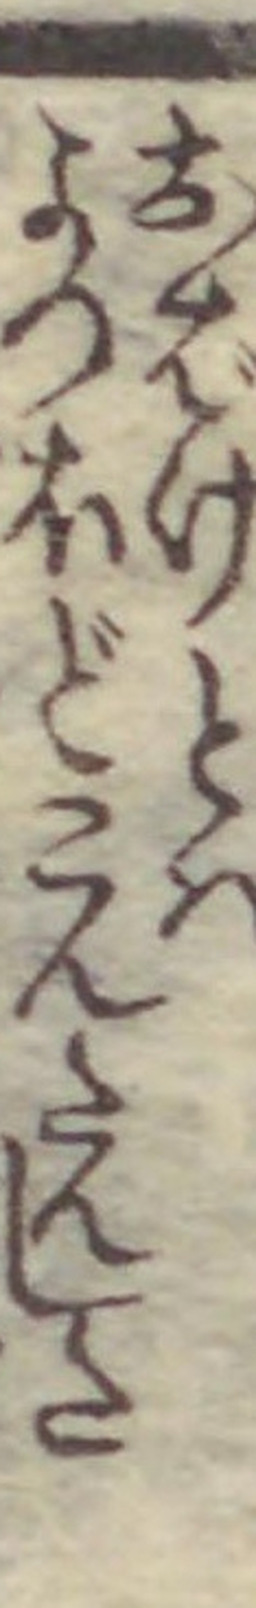よつほどこんたんした
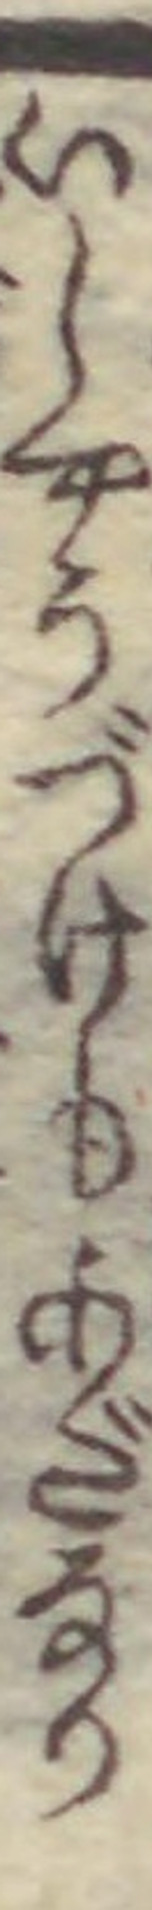いしやうづけもあだなり
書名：大時代唐土化物 3巻. 曽我太夫染
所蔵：国立国会図書館 National Diet Library, JAPAN
